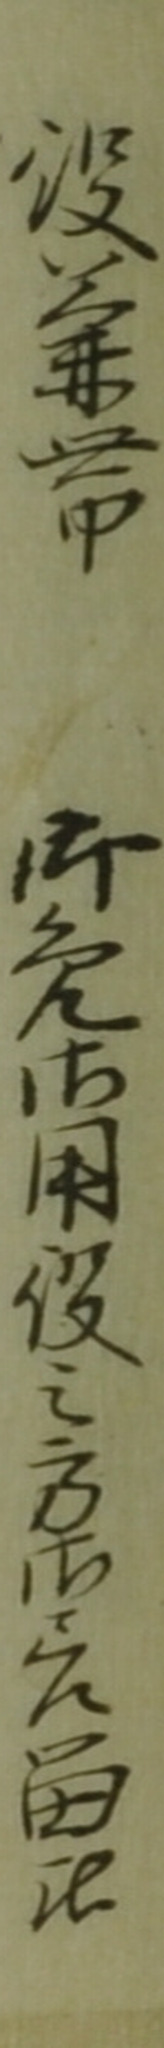役兼帯御免御用役之方御差留被
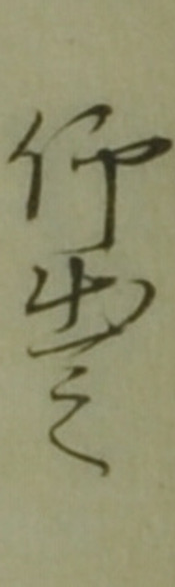仰出之
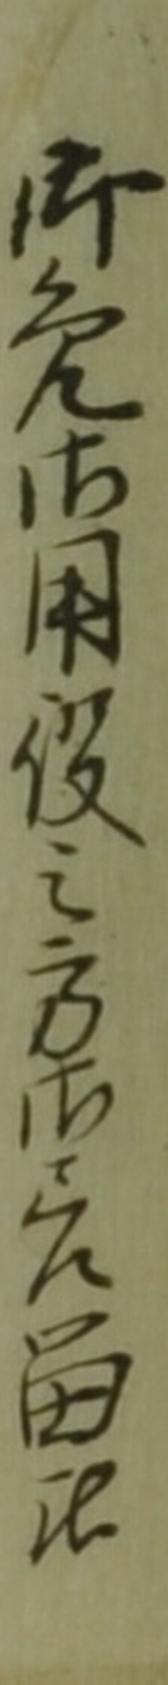役兼帯御免御用役之方御差留被
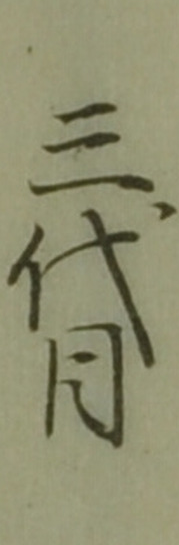三代目
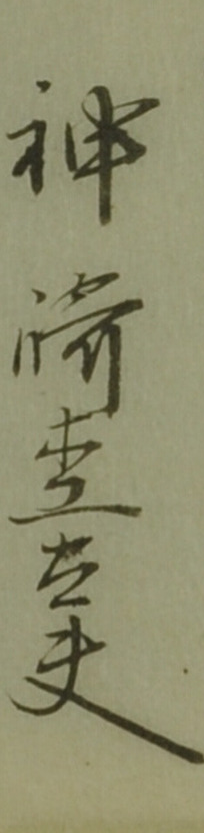神崎杢太夫
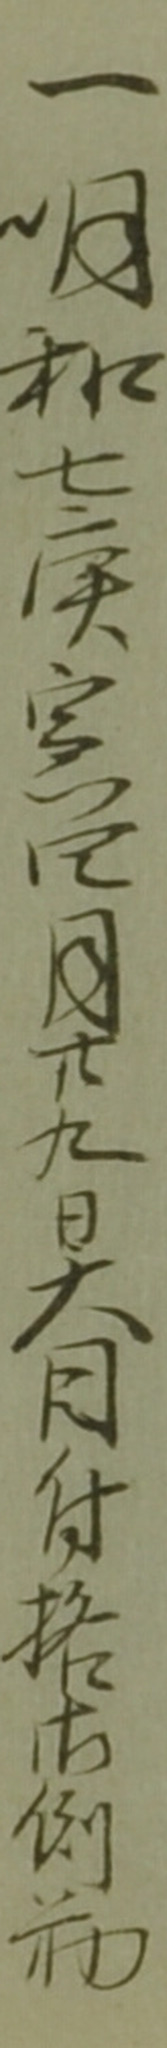一明和七庚寅四月廿九日大目付格御側勤
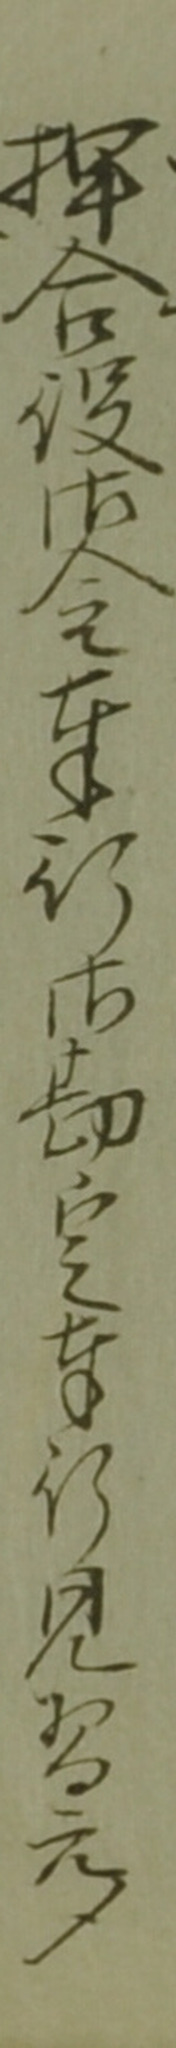押合役御金奉行御勘定奉行見習元〆
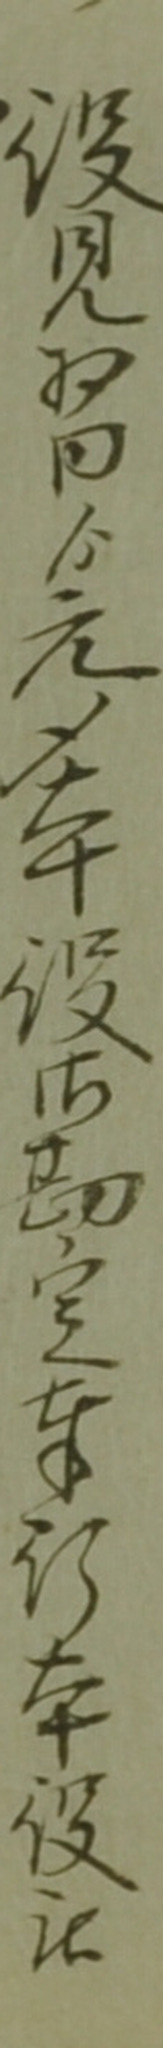役見習ゟ元〆本役御勘定奉行本役被
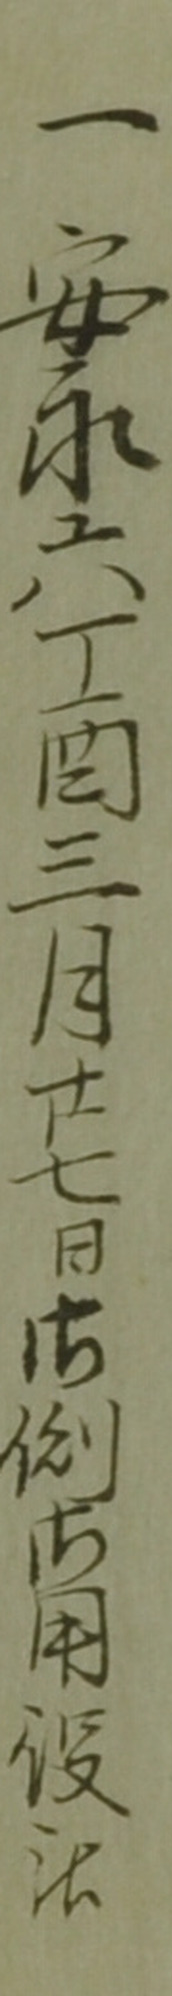一安永六丁酉三月廿七日御側御用役被
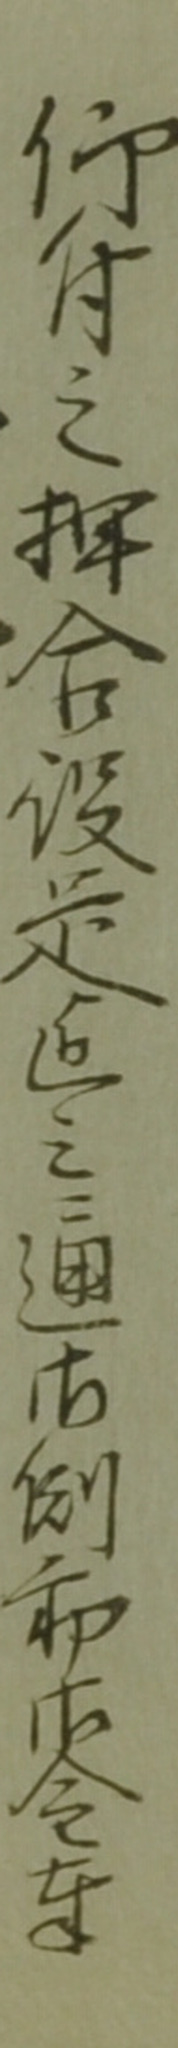仰付之押合役是迄之通御側勤御金奉
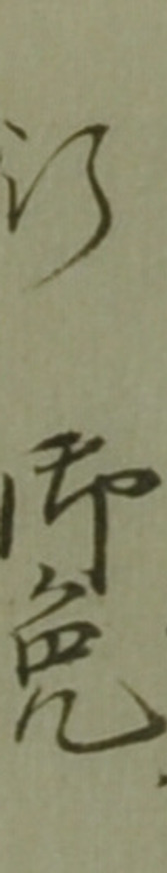行御免
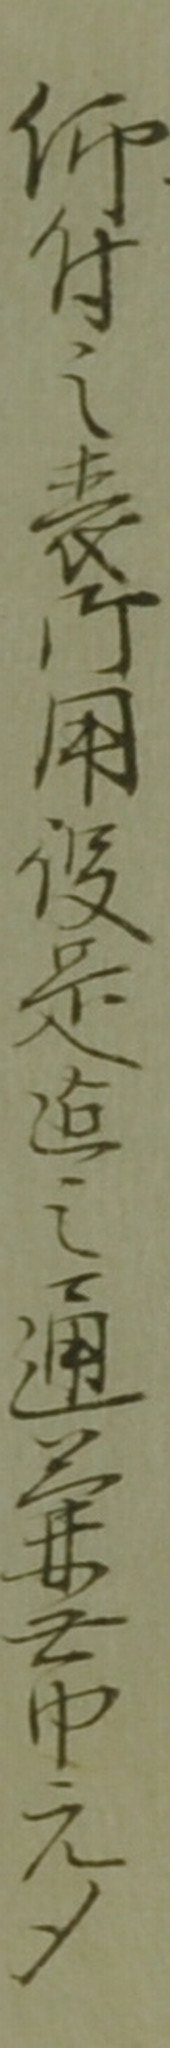仰付之表御用役是迄之通兼帯元〆
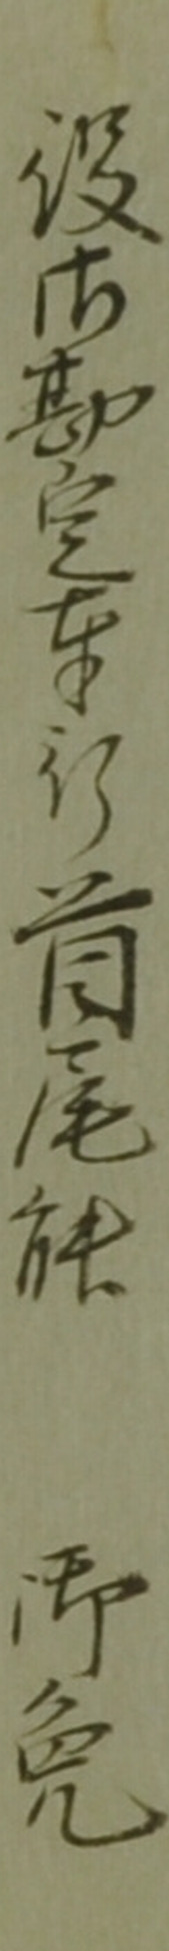役御勘定奉行首尾能御免
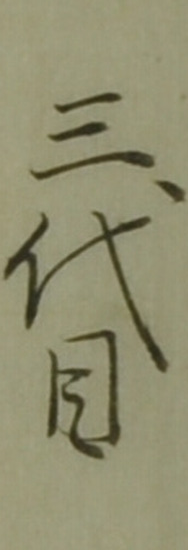三代目

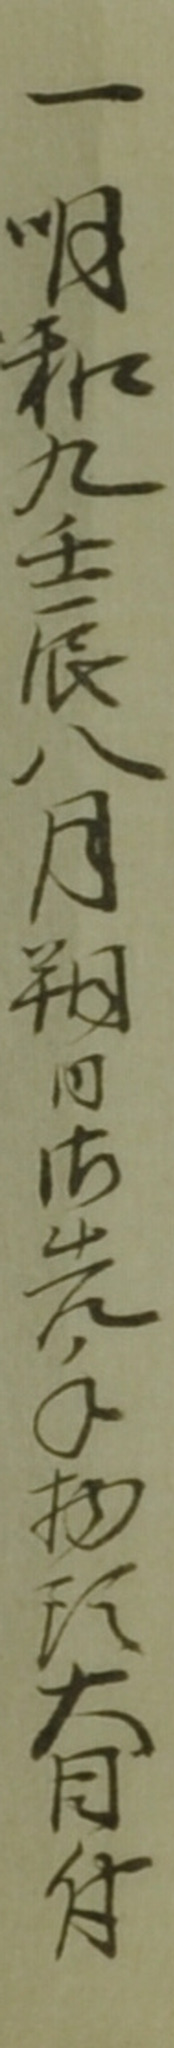一明和九壬辰八月朔日御先手物頭大目付
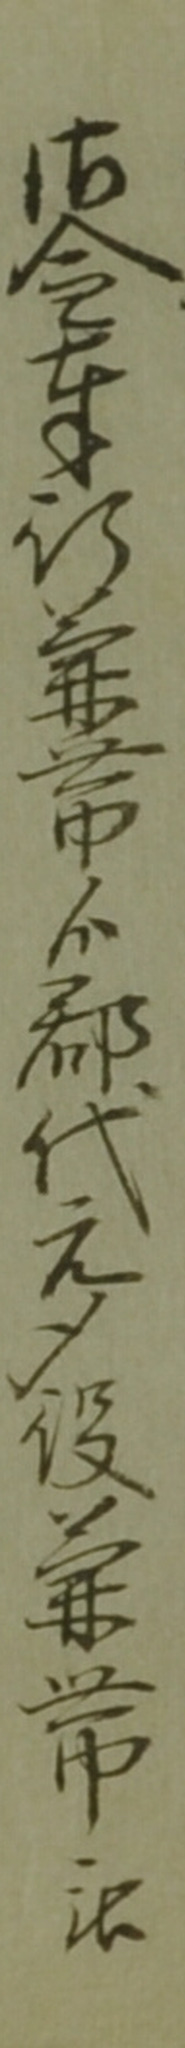御金奉行兼帯ゟ郡代元〆役兼帯被
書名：諸御役代々録（七）
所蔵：伊那市立高遠町図書館・合同会社AMANE
